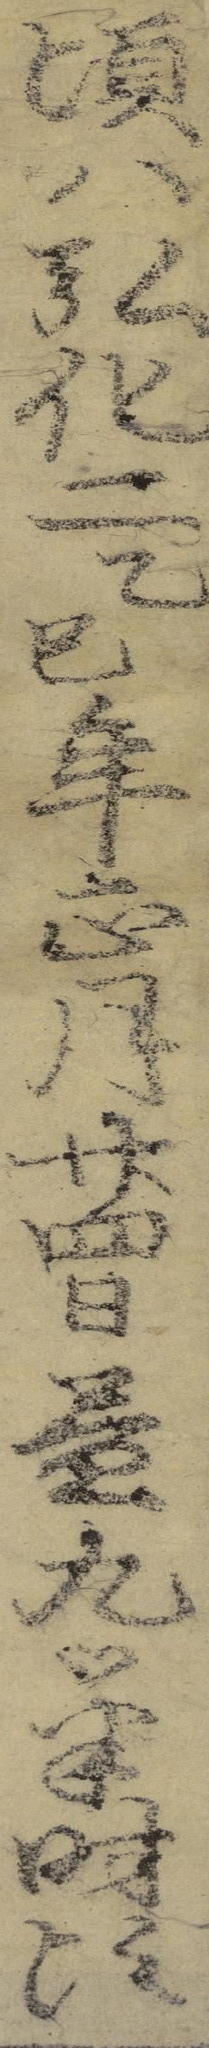頃は弘化二乙巳年正月廿四日昼九ツ半時頃
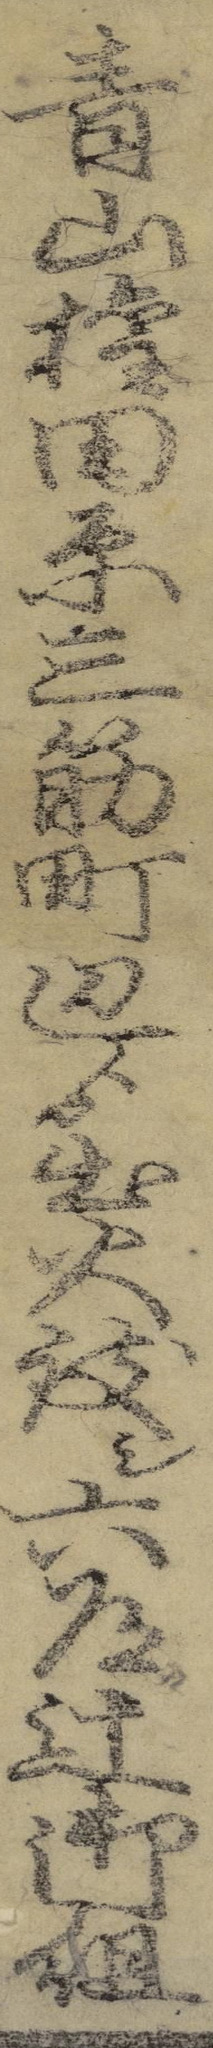青山様田原三筋町辺ゟ出火致シ六道辻御組
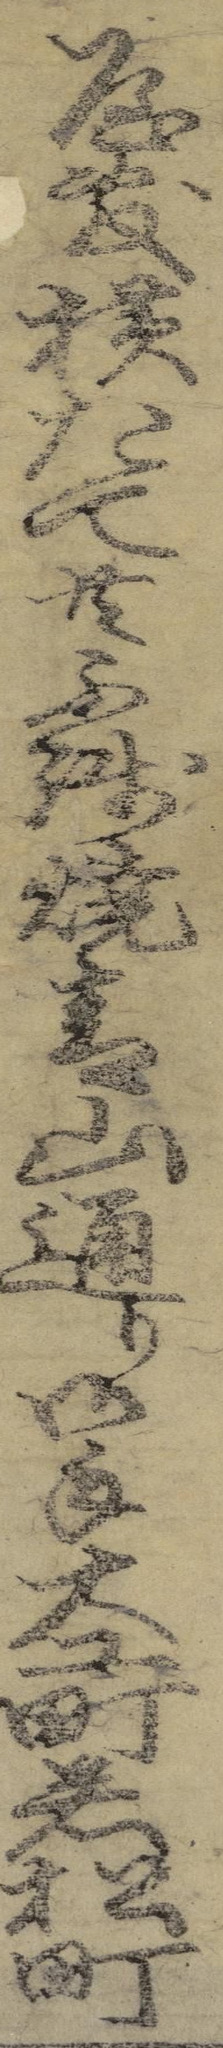屋敷横たて共不残焼青山通り御手大工町若松町
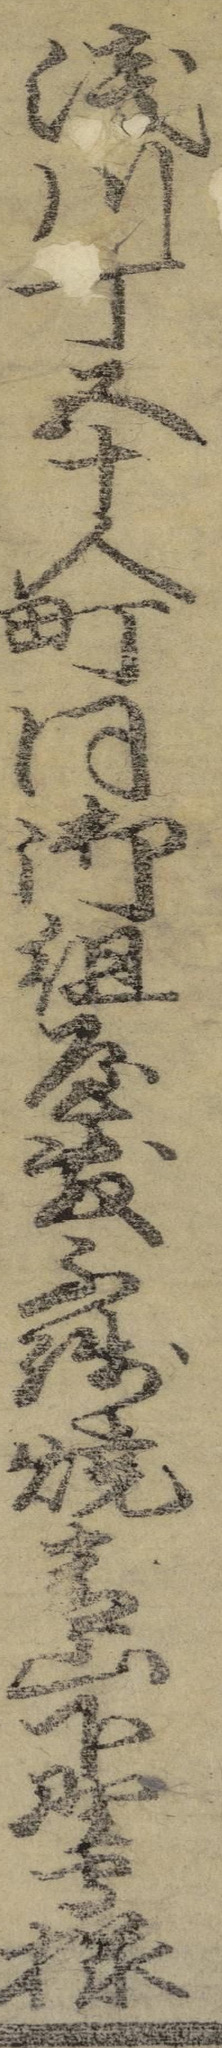浅川丁五十人町同御組屋敷不残焼青山下野守様
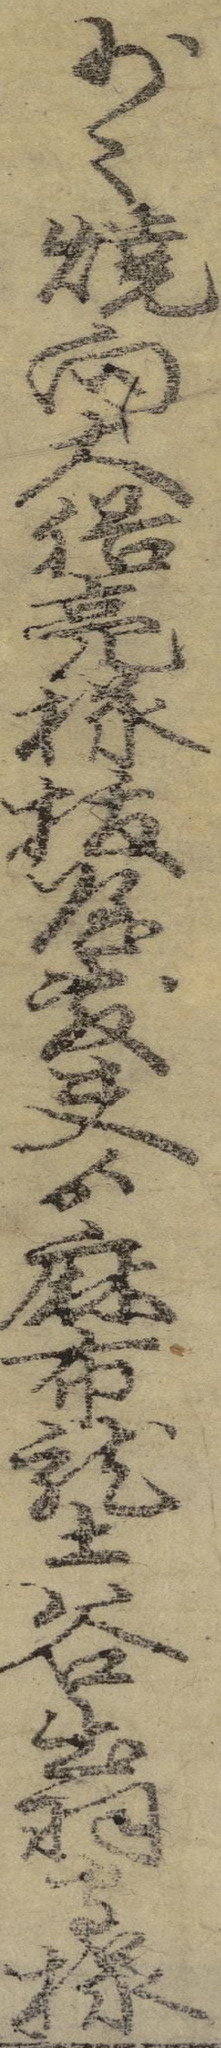少〻焼向大膳亮様抜屋敷夫ゟ麻布壟谷出羽守様
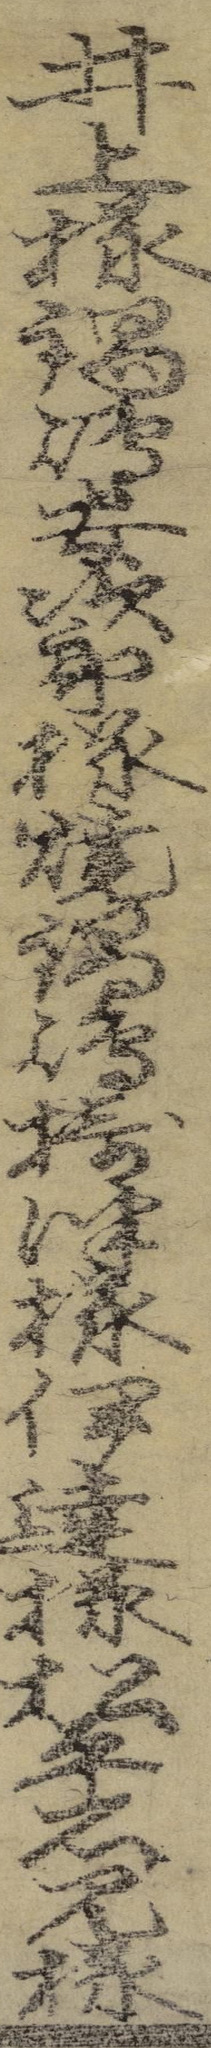井上様錫嶋安次郎様錫嶋摂津様伊達様松平石見様
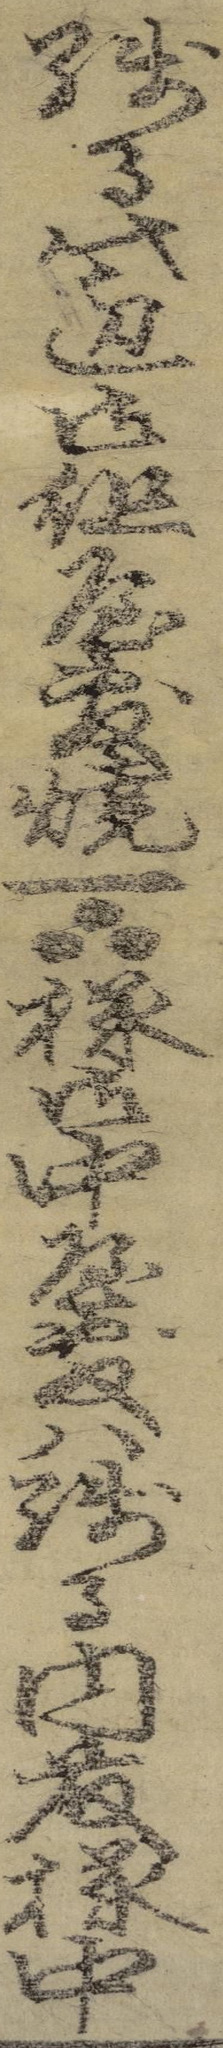残る此辺御組屋敷焼様御中屋敷は残る内藤様中
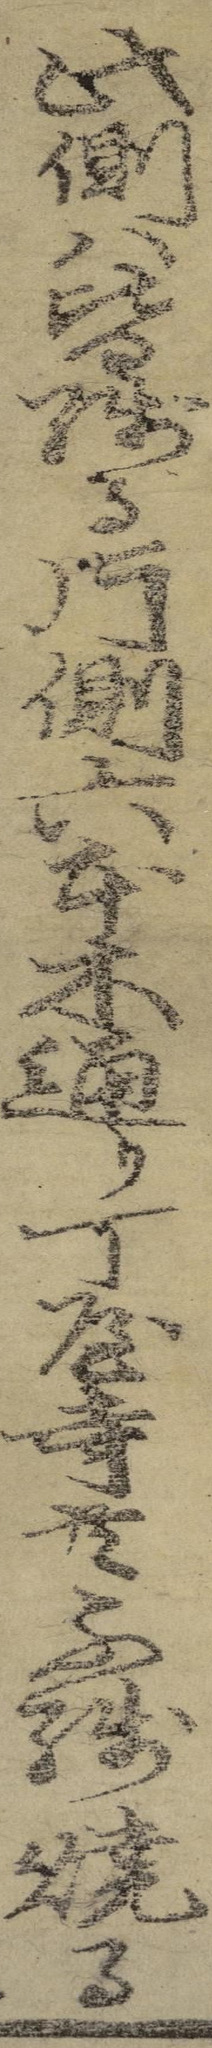此側は皆残る片側六本木通り丁屋寺共不残焼る
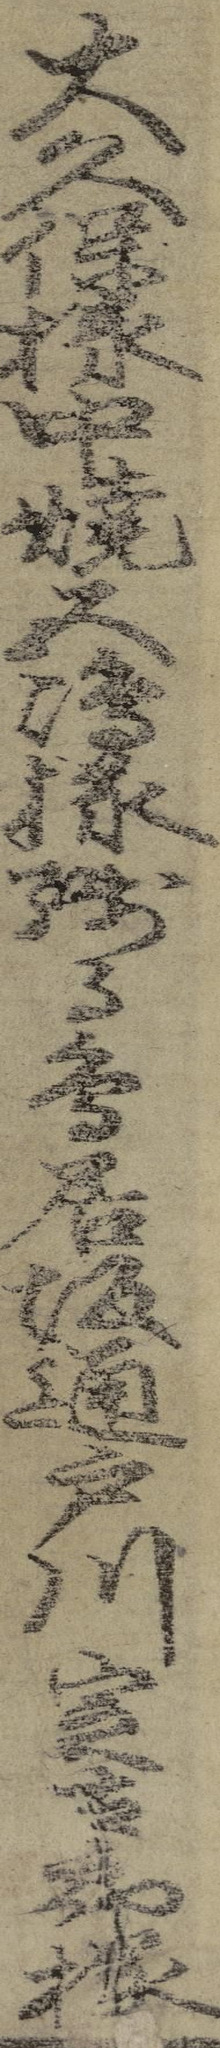大久保様中焼五嶋様残る鳥居坂通戸川定吉郎様
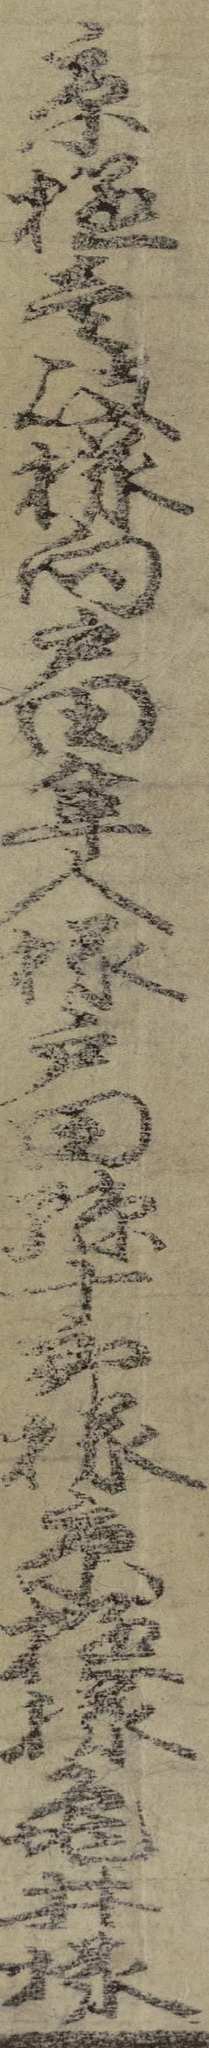京極壱岐様向戸田隼人様戸田練十郎様京極様亀井様
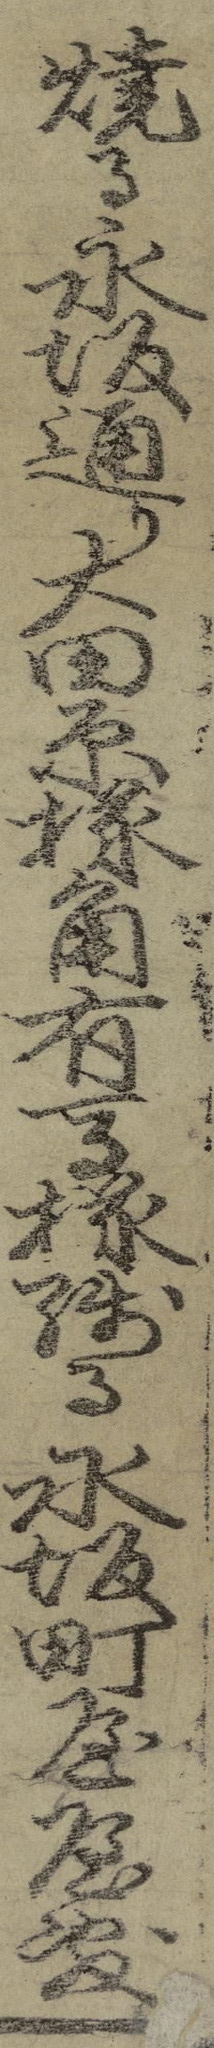焼る永坂通り大田原様角有馬様残る永坂町屋屋敷
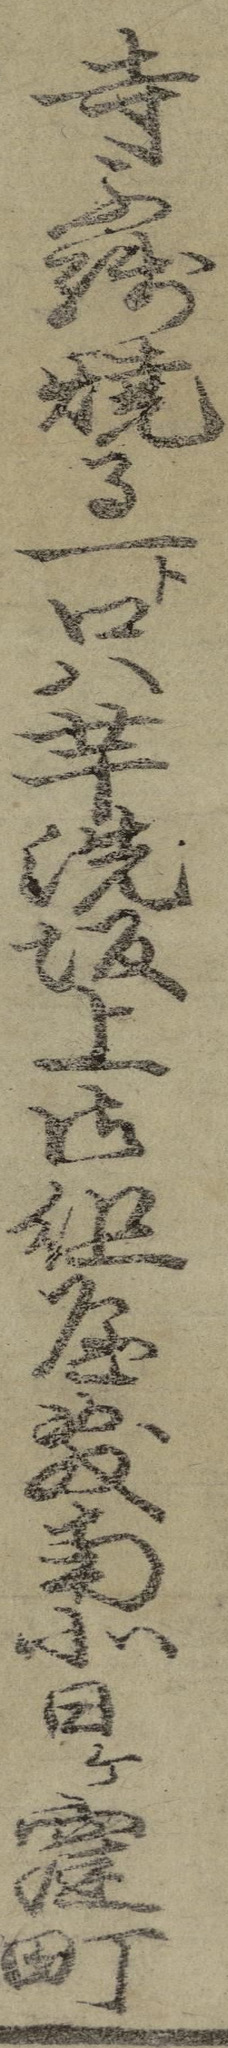寺不残焼る一芋洗坂上御組屋敷南北日窪町
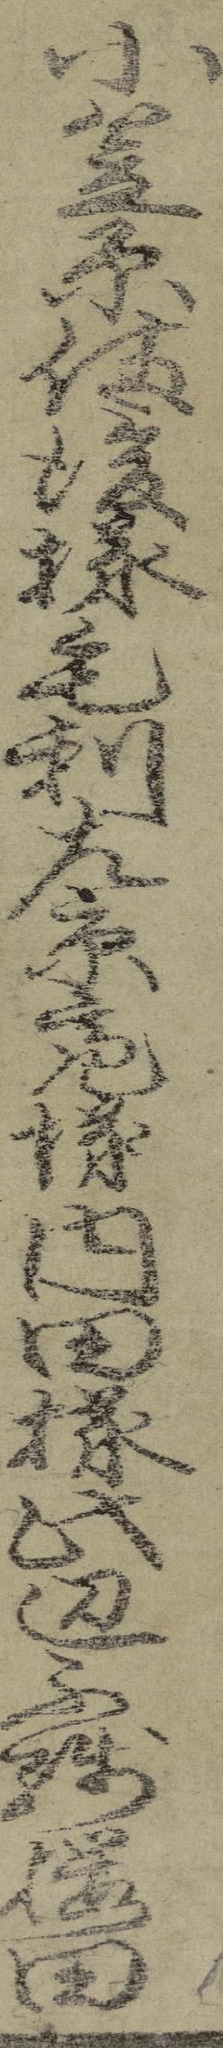小笠原備後様毛利左京亮様内田様此辺不残桜田
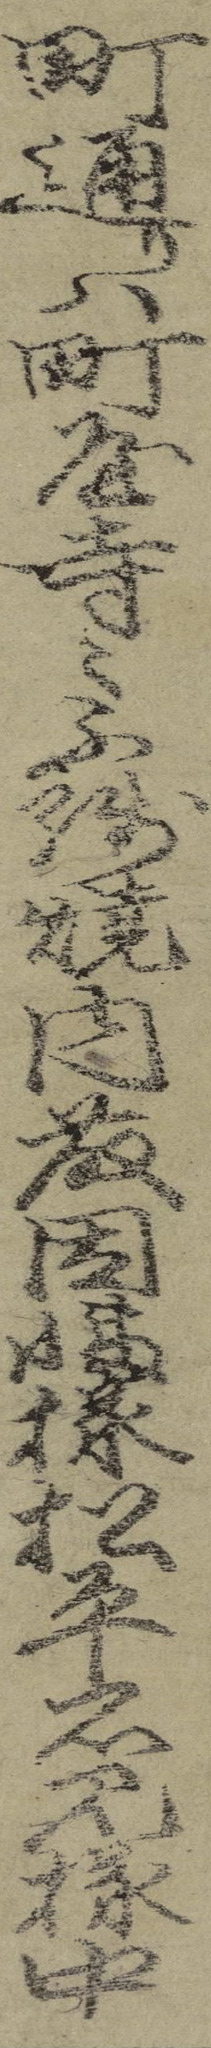町通りは町屋寺〻不残焼内藤因幡様松平石見様中
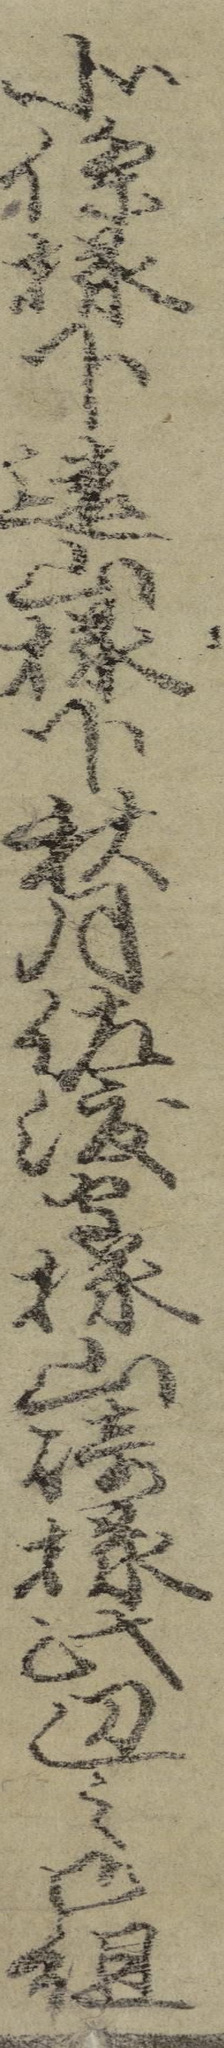北條様下遠山様下秋月佐渡守様山崎様此辺之御組
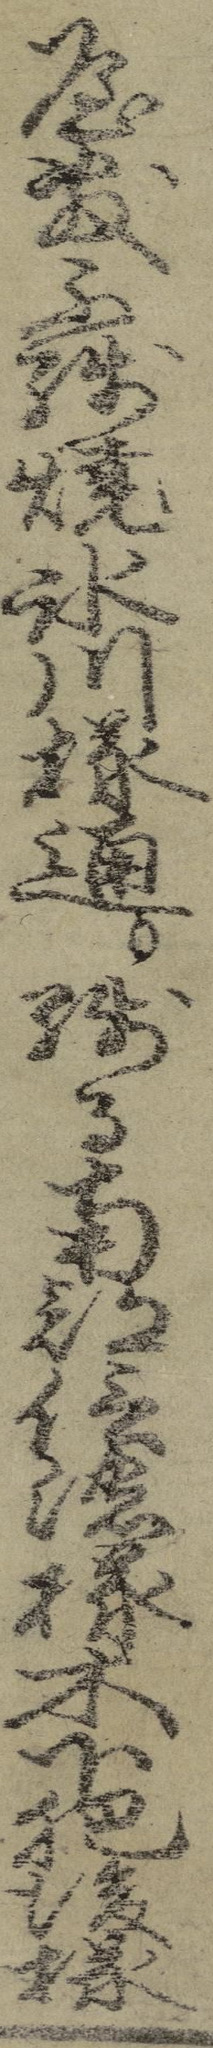屋敷不残焼氷川様通り残る南部信濃様木下肥後様
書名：[弘化二年正月の江戸大火に関する瓦版]
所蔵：東京大学地震研究所図書室 Earthquake Research Institute Library, The University of Tokyo, JAPAN
